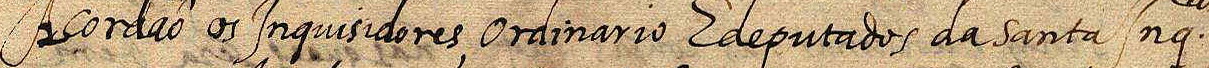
Acordão os Jnquisidores, Ordinario E deputados da santa Jnq.cam
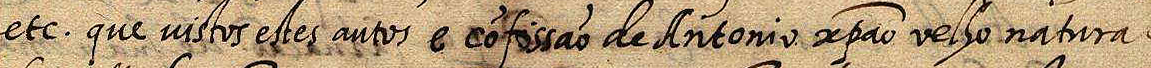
etc. que uistos estes autos e cōfissaõ de Antonio xpão velho natural
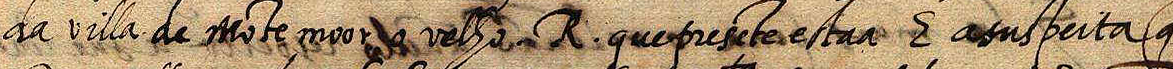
da villa de Mōtemoor o velho .R. que presēte estaa E a suspeita q̄
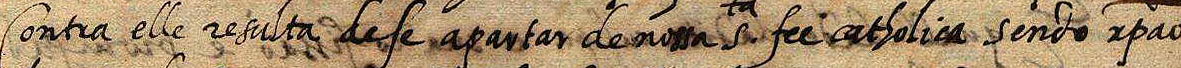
Contra elle resulta de se apartar de nossa sta. fee catholica sendo xpão
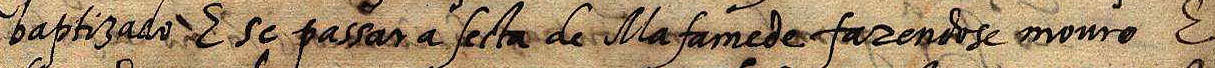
baptizado E se passar a secta de Mafamede fazendose mouro E
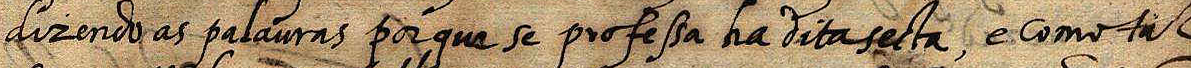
dizendo as palauras porque se professa ha dita secta, e como tal
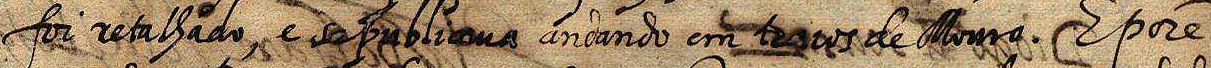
foi retalhada, e se publicaua andando em traios de Mouro. E porē
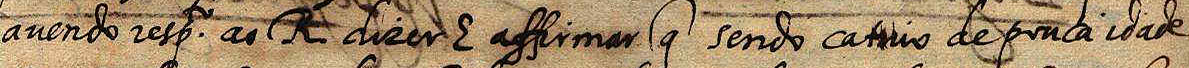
auendo resp.to ao R. dizer E affirmar q̄ sendo catiuo de pouca idade
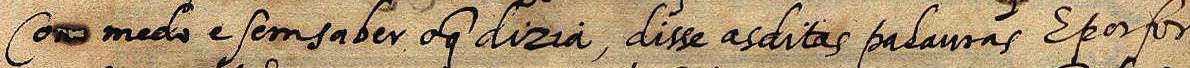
Com medo e sem saber o q̄ dizia, disse as ditas palauras E por for
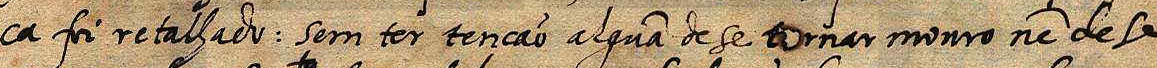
ca foi retalhado: sem ter tencaõ alguā de se tornar mouro nē de se
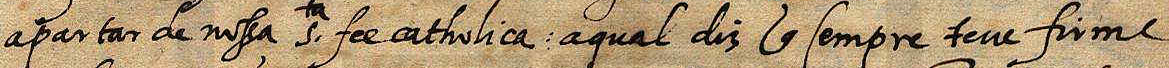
apartar de nossa s.ta fee catholica: a qual diz q̄ sempre teue firme
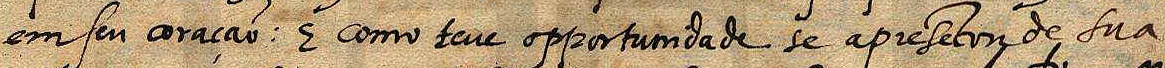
em seu coraçaõ: E como teue opportunidade se apresētou de sua
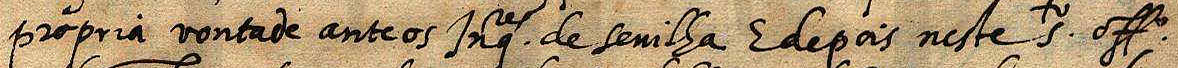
propria vontade ante os Jnq.res de seuilha E depois neste sto. offo.
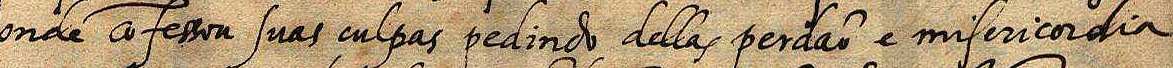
onde c̄ofessou suas culpas pedindo dellas perdaõ e misericordia
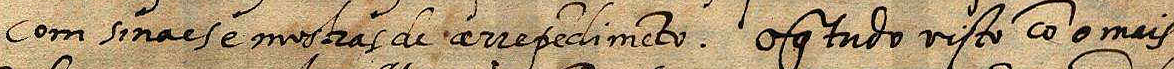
com sinaes e mostras de arrepēdimēto. o q̄ tudo visto c̄o o mais
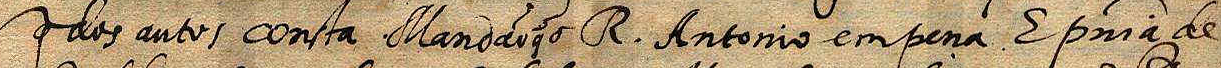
q̄ dos autos consta. Mandaõ q̄ o R. Antonio em pena E pnīa de
